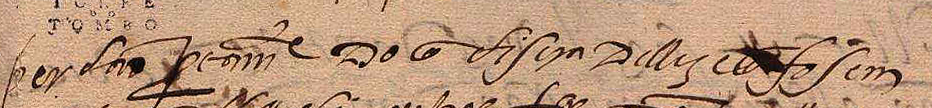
perdão ꝓcam̄te Do q̄ disera Dellez e q̄ fosem
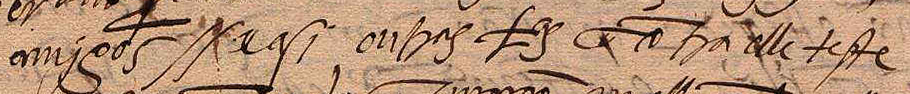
amjgos // e asi outras tas q̄ cōtra elle teste
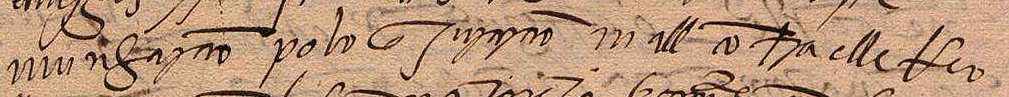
munharão polo q̄ Jurarão mall cōtra elle Reo
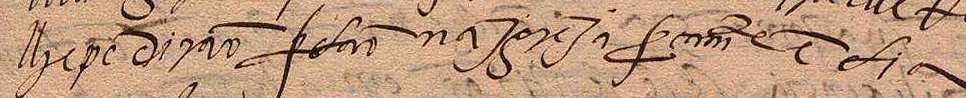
lhe pediraõ ꝑdaõ na JgreJa ꝓcam̄te ē dia
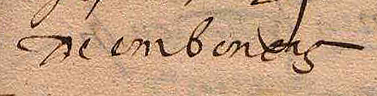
De emdoencas
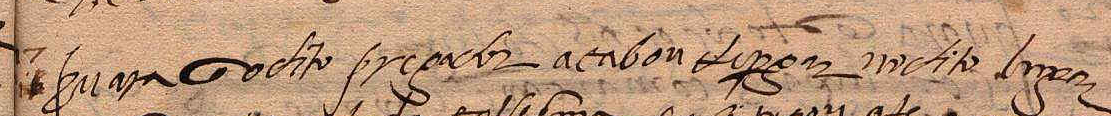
7 ꝓuara q̄ o dito pregador acabou de ꝑgar no dito lugar
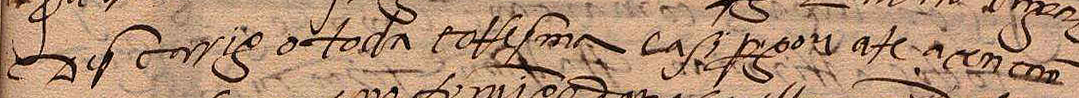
Descarrigo toda coResma e asi ꝑgou ate acencaõ
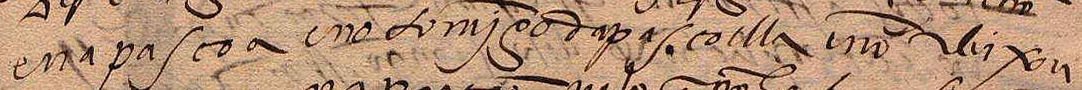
e na pascoa e no domj̄go da pascoella nō deixou
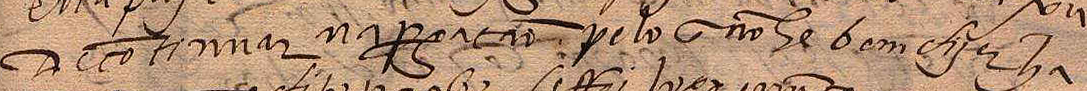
De cōtinuar na ꝑgacaõ pelo q̄ nō he bem dizer ha
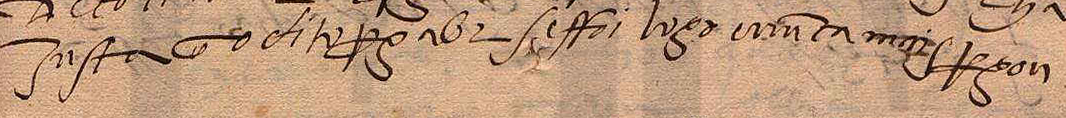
Justa q̄ o dito ꝑgador se ffoi logo e nūca mais ꝑgou
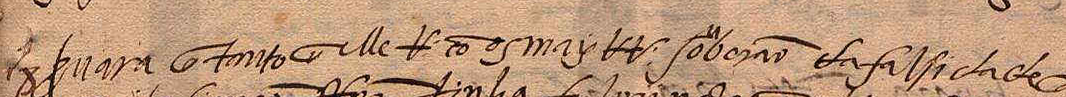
8 ꝓuara q̄ tanto q̄ elle R cō os mais RR. souberão da falsidade q̄
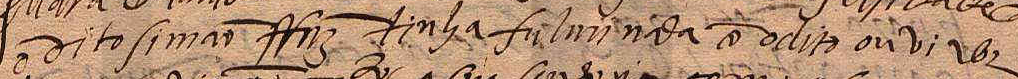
o dito simaõ ffrz̄ tinha fulminada cō o dito ouvidor
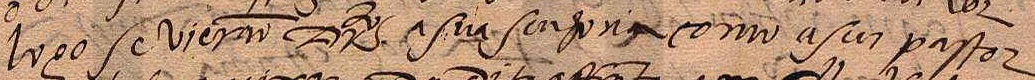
logo se vierão Drtos. a sua senhoria como a seos pastor
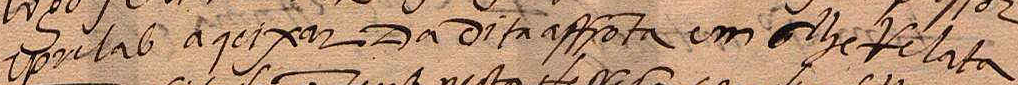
e prelado a qeixar Da dita affrōta em q̄ lhe Relata
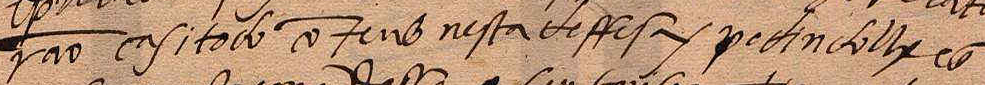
rão casi todo cōteudo nesta deffesa / pedindolhe e q̄
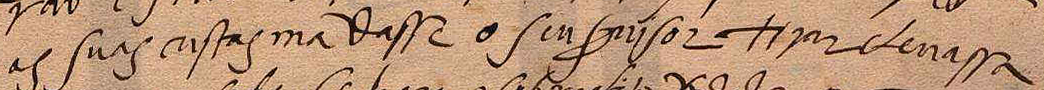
as suas custas mādasse o seu ꝓujsor tirar deuassa
